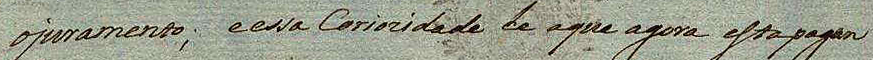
o juramento; e essa Coriozidade he a que agora esta pagan
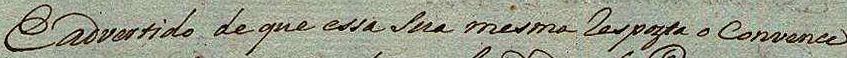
E advertido de que essa sua mesm respozta o convence
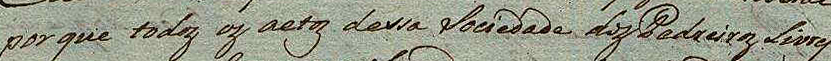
por que todoz oz actoz dessa Sociedade doz Pedreiroz Livres
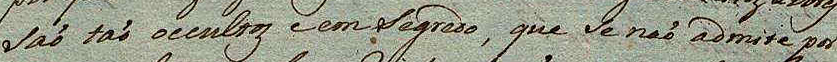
saõ tão occultoz e em Segredo, que se naõ admite por
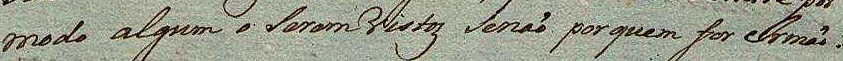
modo algum o serem vistoz senaõ por quem for Irmaõ?
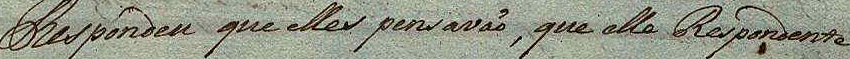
Respondeu que elles pensavaõ, que elle Respondente
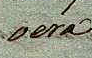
o era
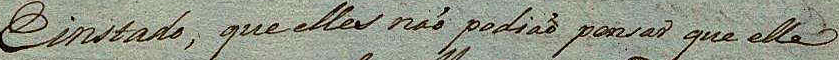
E instado, que elles naõ podiaõ pensar que elle
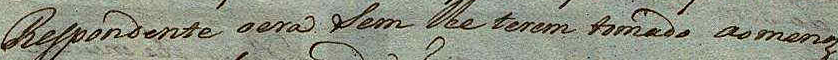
Respondente o era sem lhe terem tomado ao menoz
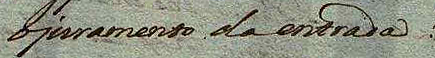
o juramento da entrada?
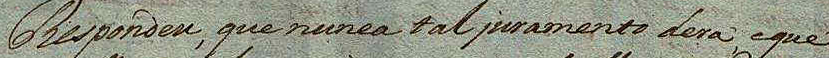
Respondeu, que nunca tal juramento dera, e que
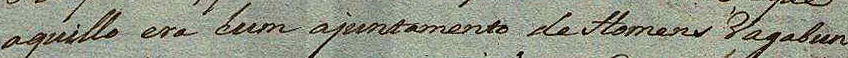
aquillo era hum ajuntamento de Homens Vagabun
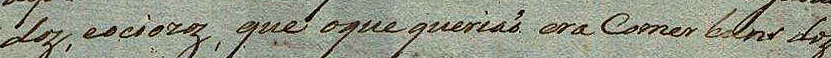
doz, e ociozos, que o que queriaõ era comer bens doz
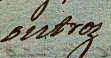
outroz.
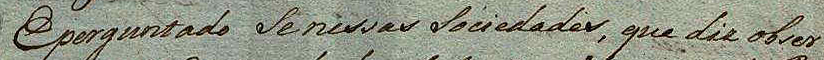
E perguntado se nessas Sociedades, que diz obser
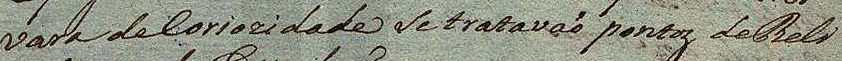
vara de Coriozidade se tratavaõ pontoz de Reli
